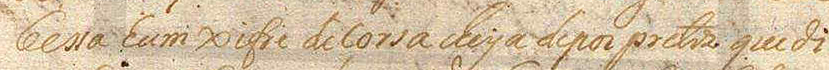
bessa hum xifre de corsa cheya de pos pretoz. que di
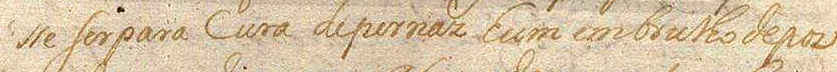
sse ser para Cura de pernaz hum embrulho de poz
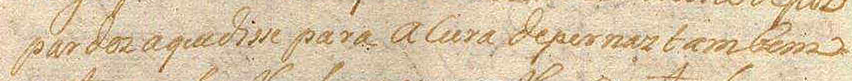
pardoz a que disse para a cura de pernaz tambem
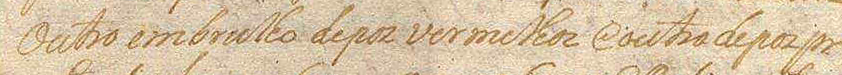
Outro embrulho de poz vermelhoz e outro de poz pr
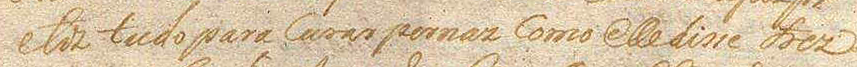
etoz tudo para Curar pernaz Como Elle disse trez
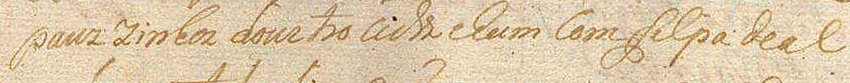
pauzzinhos dous trocidos e hum Com felpa de al
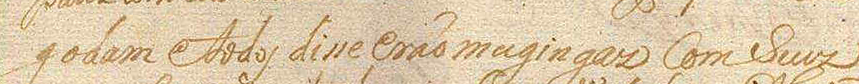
godam e todos disse eraõ mugingaz Com Seuz
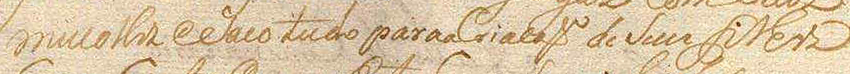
miuolloz e Saco tudo para a Criaçaõ de seus filhoz
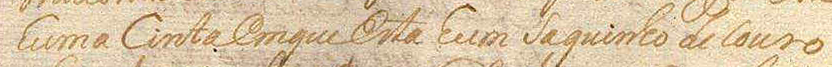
huma Cinta Em que Esta hum saquinho de couro
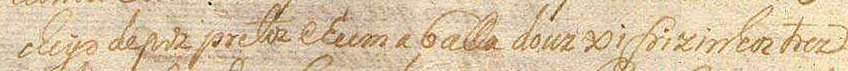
cheyo de poz pretoz e huma balla douz xifrizinhos trez
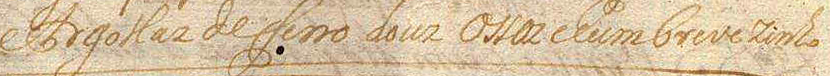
Argollaz de ferro douz ossoz e hum brevezinho
